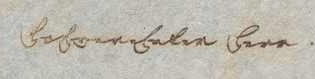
Hochverehrter Herr.
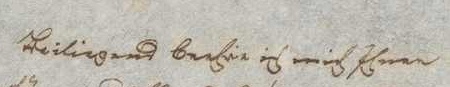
Beiliegend beehre ich mich Ihnen
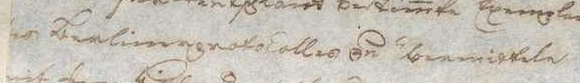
des Berlinerprotokolles zu übermitteln
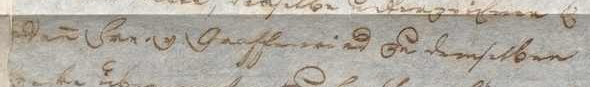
dann Hrn. v. Graffenried zu demselben
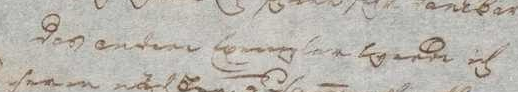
Das andere Exemplar werde ich
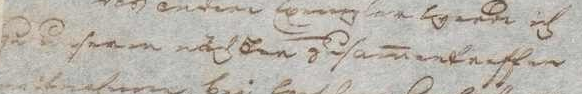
zu unserm nächsten Zusammentreffen
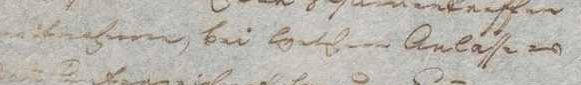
mitnehmen, bei welchem Anlasse es
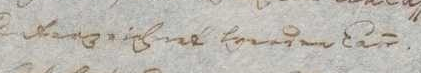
unterzeichnet werden kann.
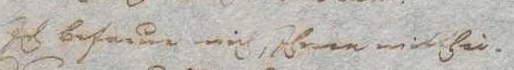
Ich befreue mich, Ihnen mitthei-
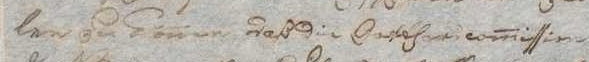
lein zu können, daß die Gotthardcommission
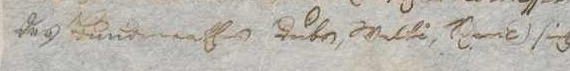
des Bundesrathes (Dubs, Welti, Schenk) sich
